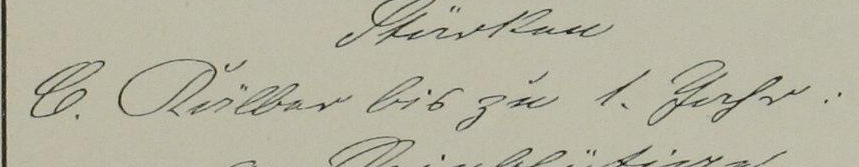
C. Kälber bis zu 1 Jahr:
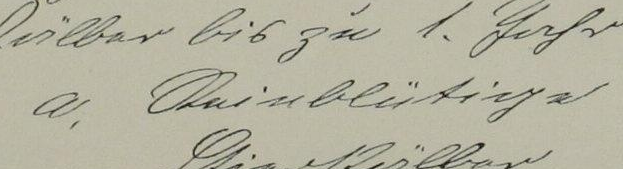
a. Reinblütige
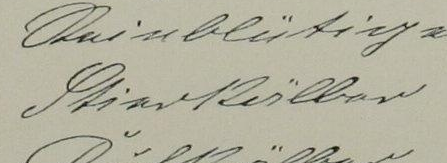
Stierkälber
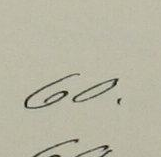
60
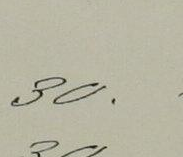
30
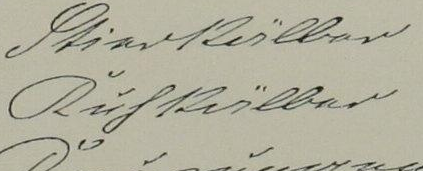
Kuhkälber
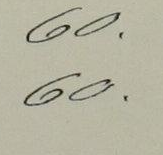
60
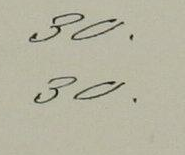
30
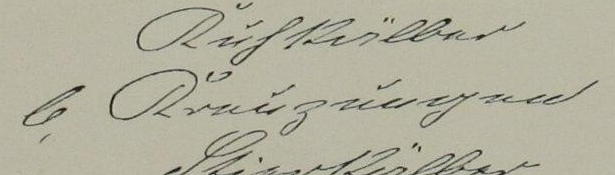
b. Kreuzungen
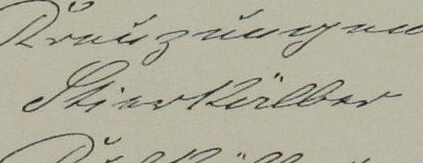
Stierkälber
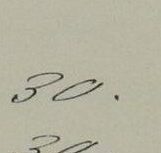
30
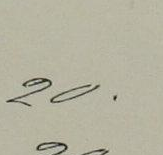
20
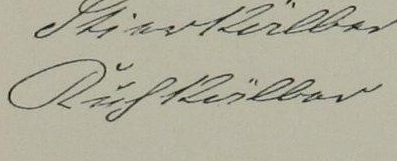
Kuhkälber
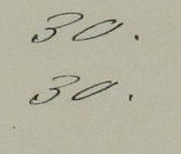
30
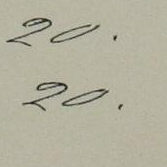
23
